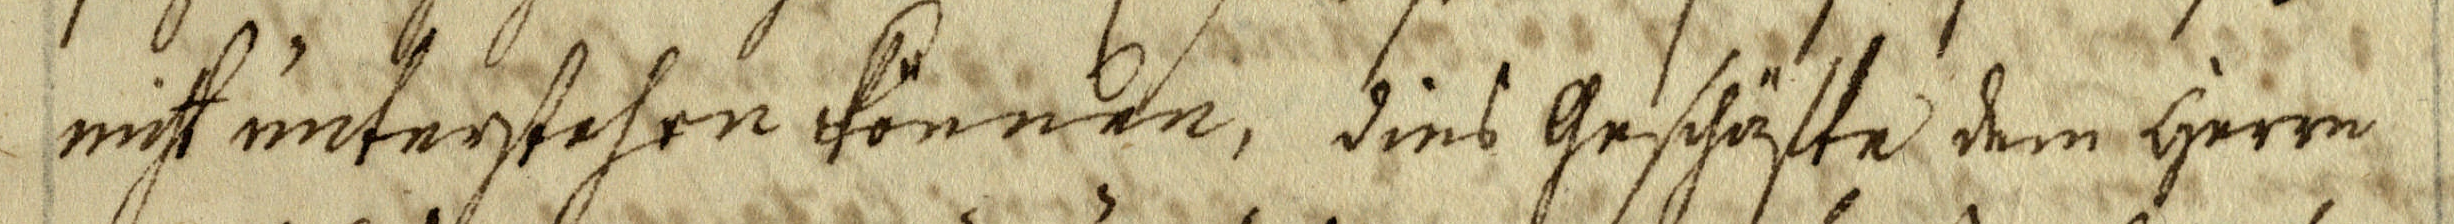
nicht unterstehen können, dies Geschäfte dem Herrn
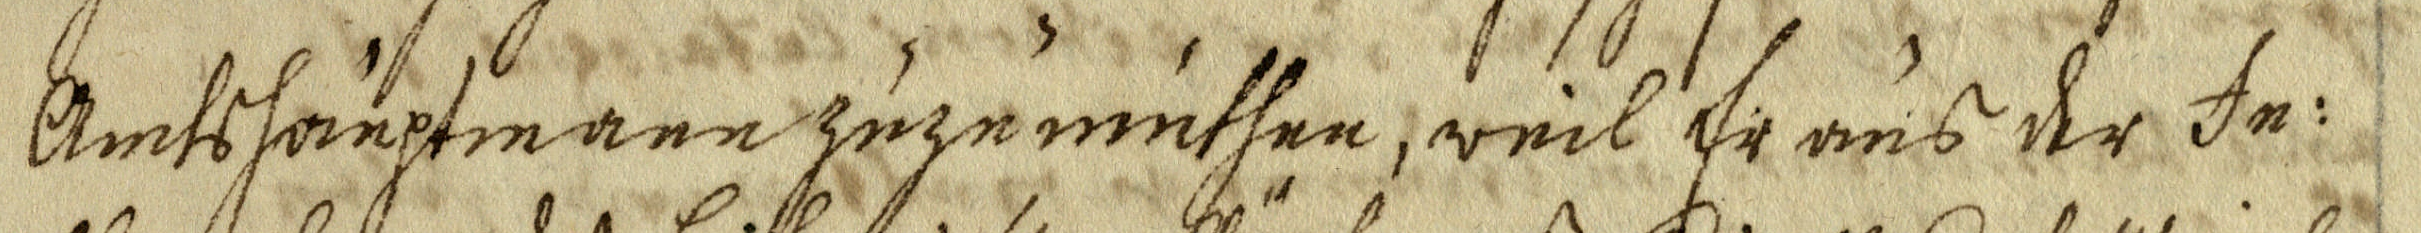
Amtshauptmann zuzumuthen, weil Er aus der In¬
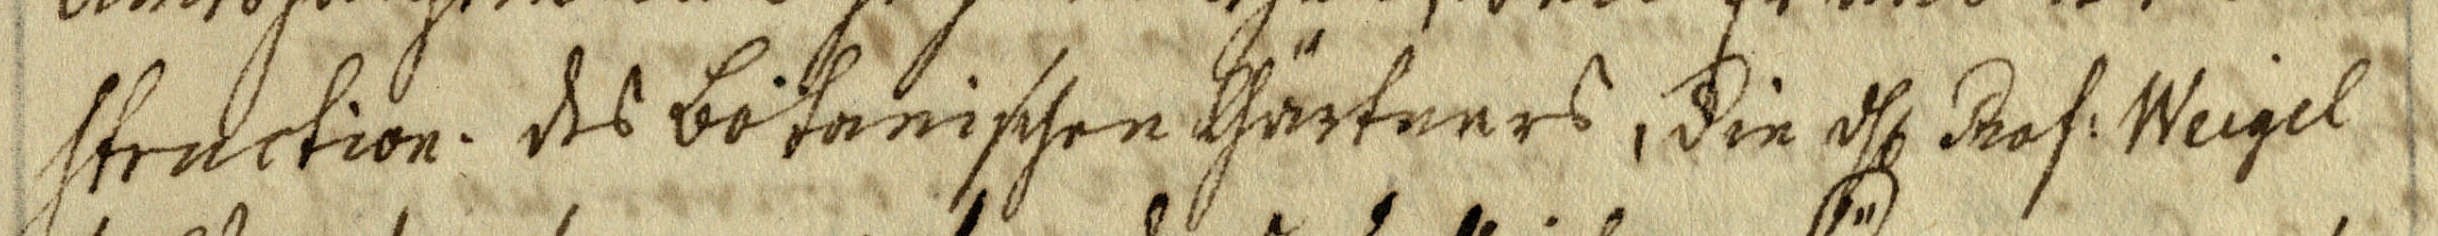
struction des Botanischen Gärtners, die dh Prof. Weigel
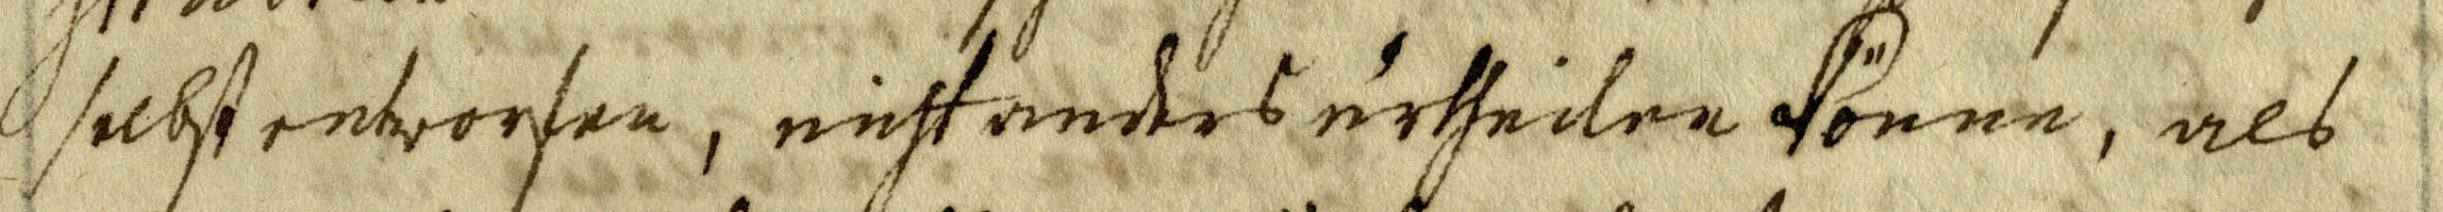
selbst entworfen, nicht anders urtheilen könne, als
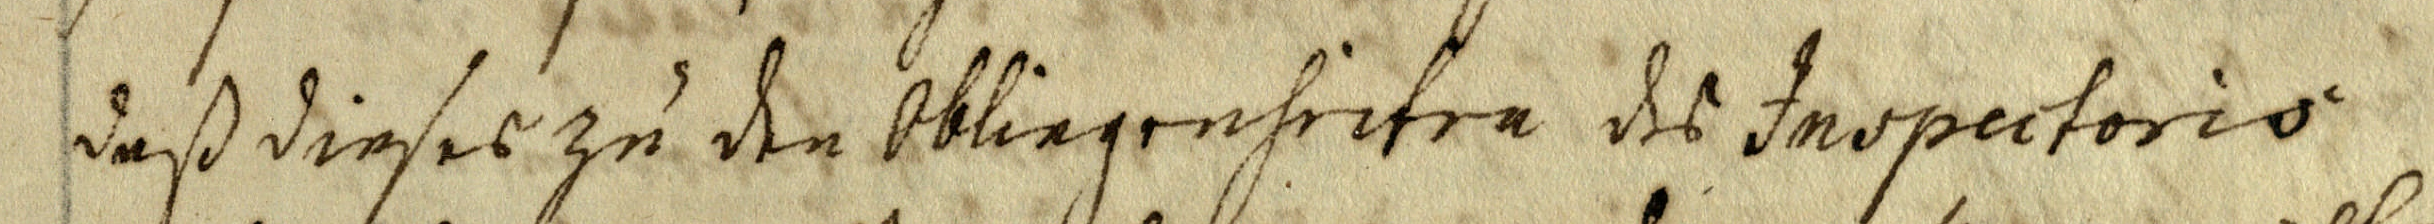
daß dieser zu den Obliegenheiten des Inspectoris
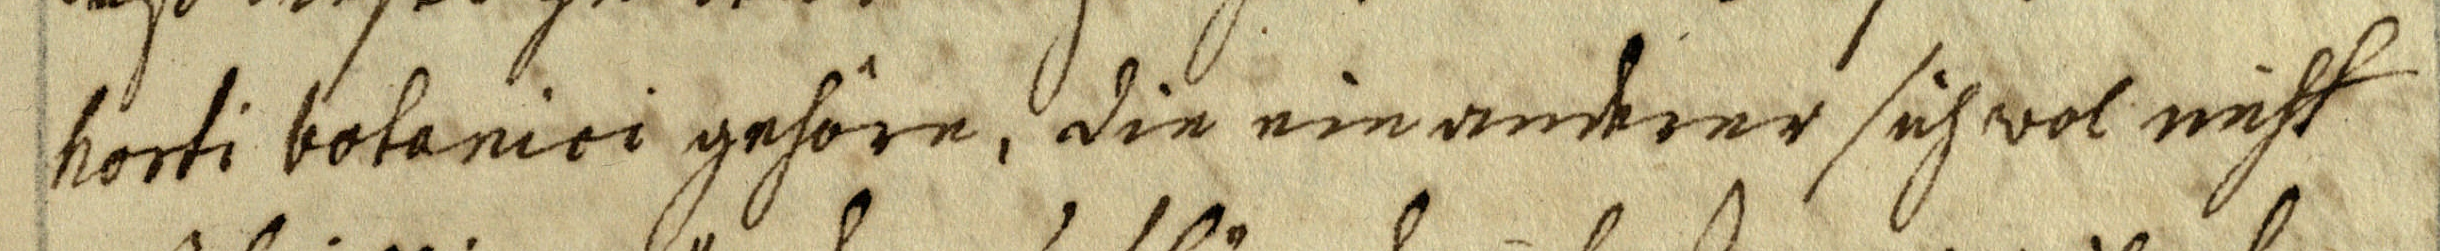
horti botanici gehöre, die ein anderer sich wol nicht
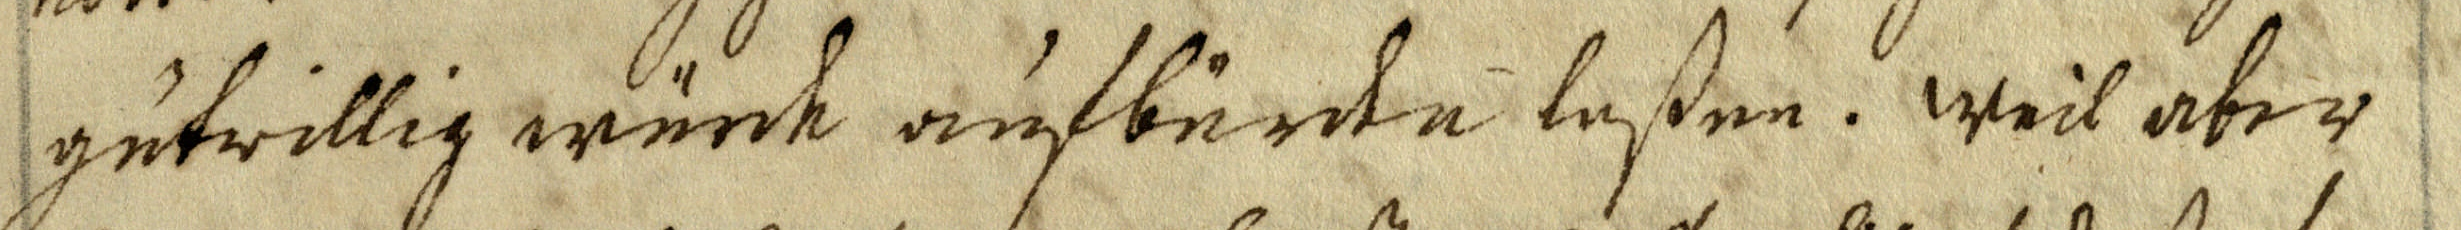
gutwillig würde aufbürden laßen. Weil aber
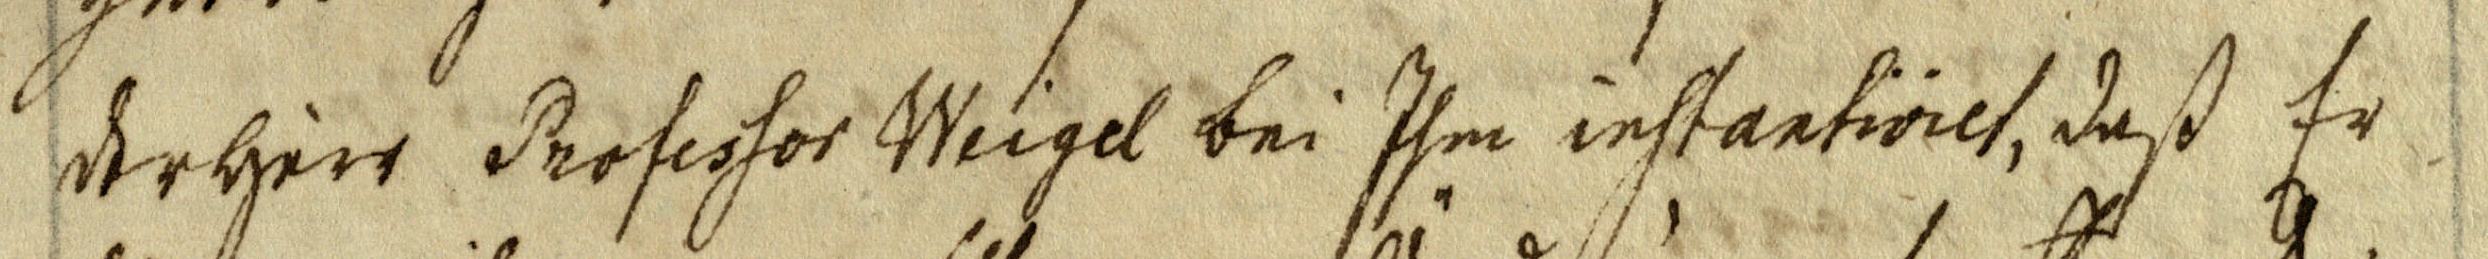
der Herr Professor Weigel bei Ihm instantiret, daß Er
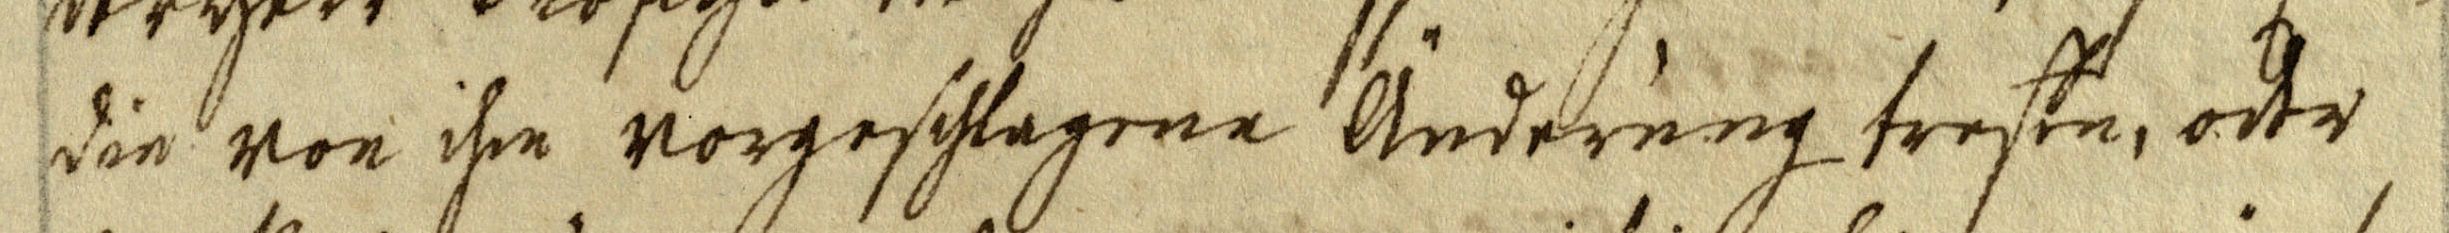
die von ihm vorgeschlagene Änderung treffen, oder
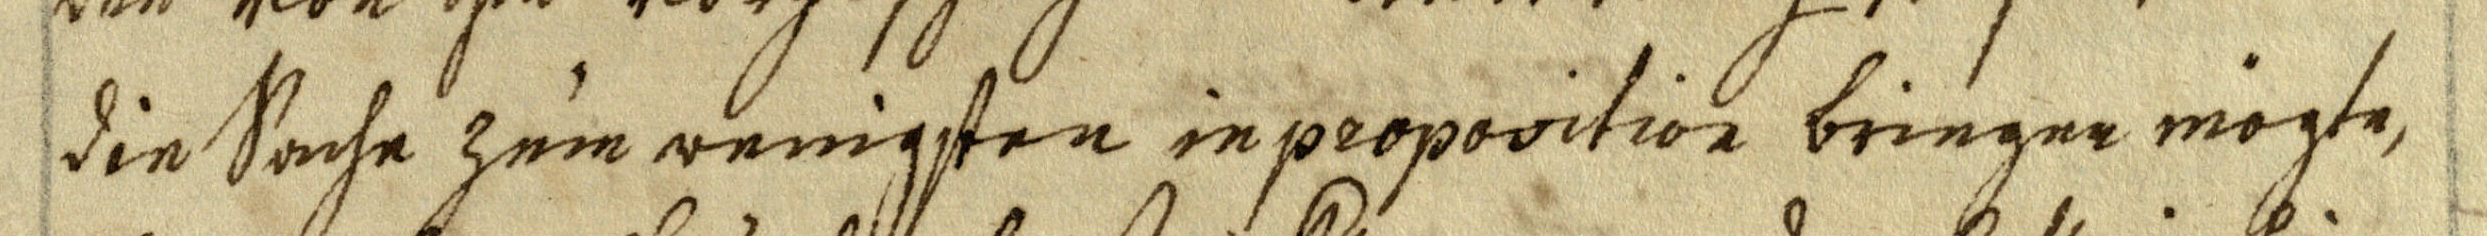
die Sache zum wenigsten in proposition bringen mögte,
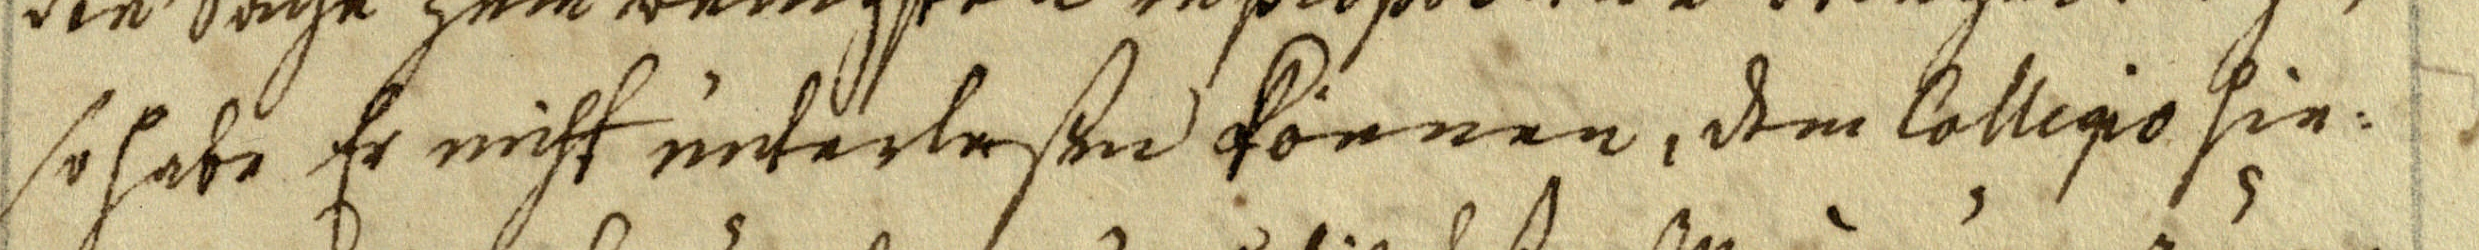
so habe Er nicht unterlaßen können, dem Collegio hie¬
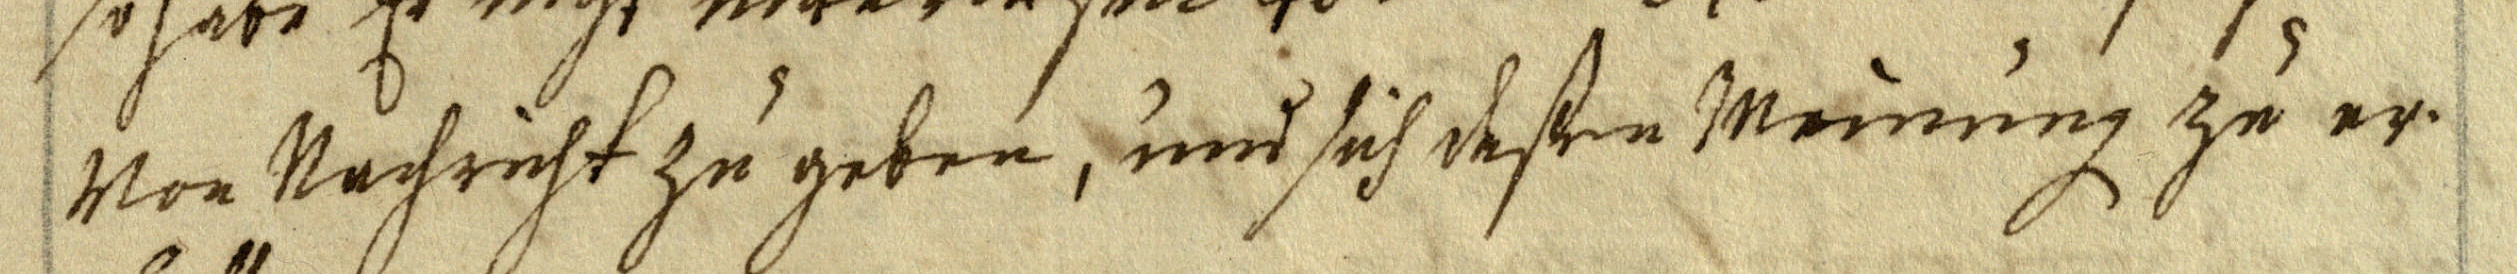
von Nachricht zu geben, und sich deßen Meinung zu er¬
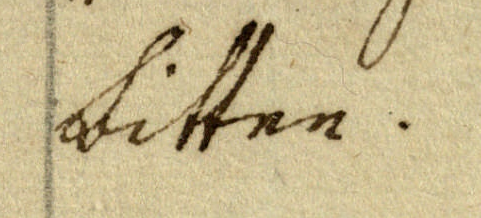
bitten.
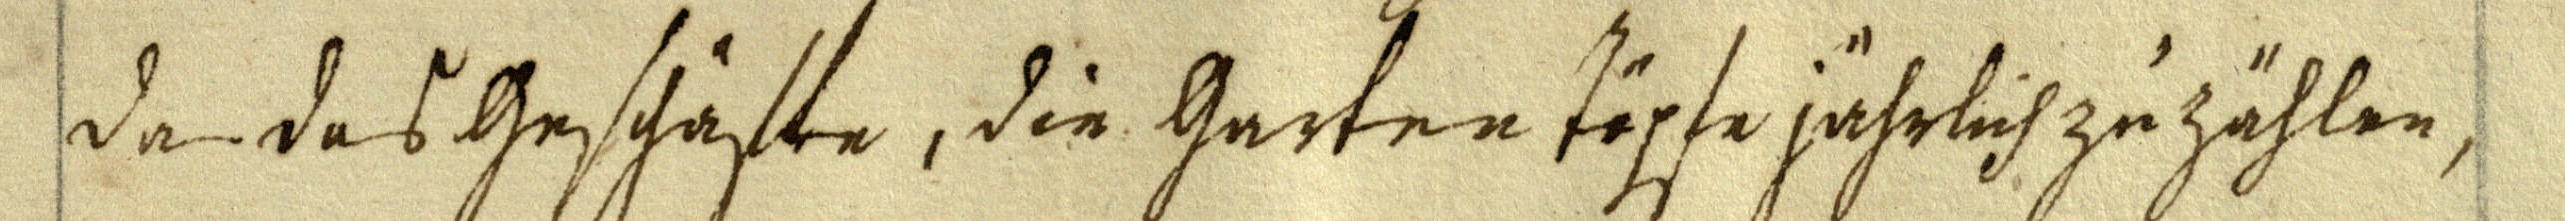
Da das Geschäfte, die Garten Töpfe jährlich zu zählen,
